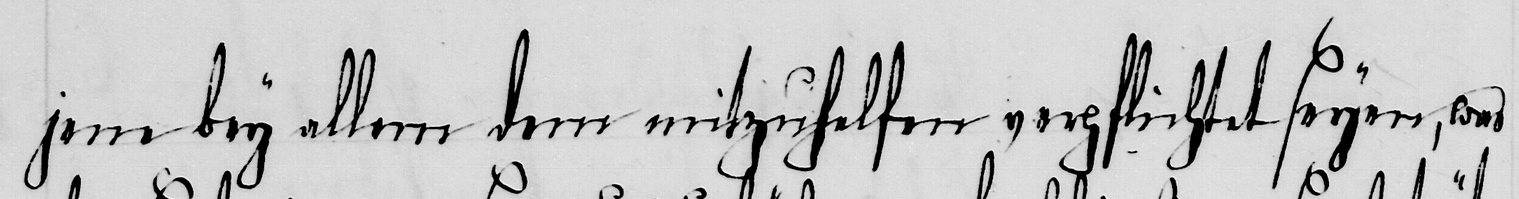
jene bey allem dem mitzuhelfen verpflichtet seyen,
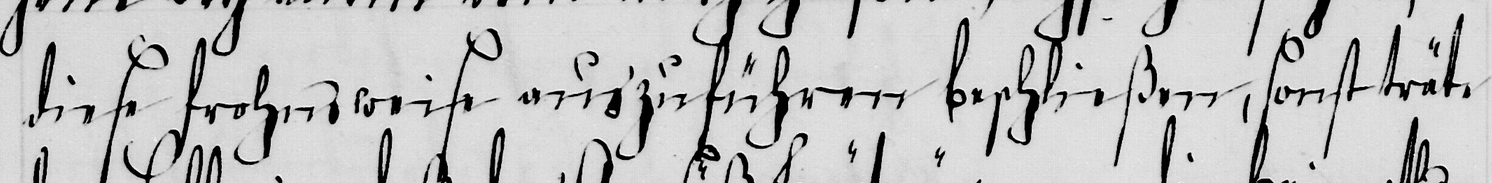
diese frohnweise auszuführen beschließen, sonst träte
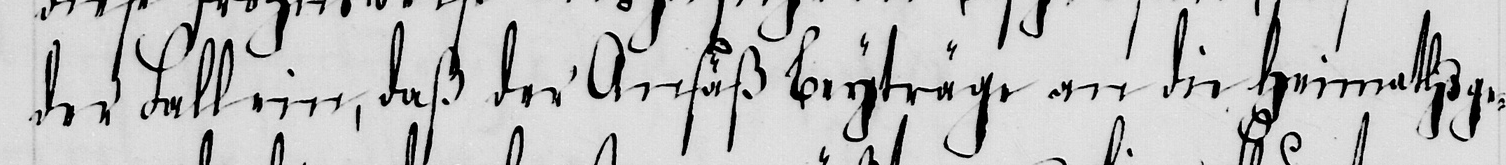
der Fall ein, daß der Ansäß Beyträge an die Heimathsg¬
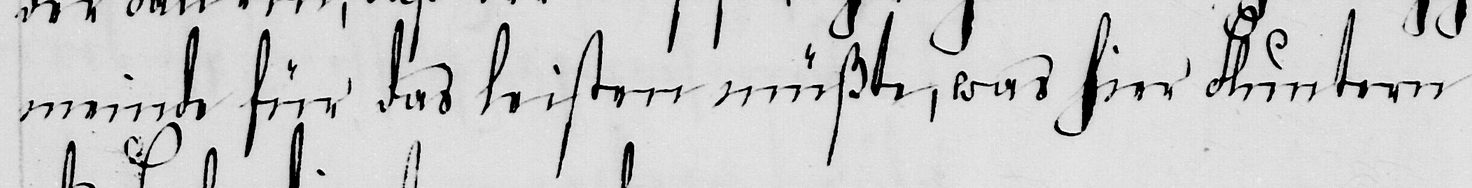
emeinde für das leisten müßte, was hier Fluntern
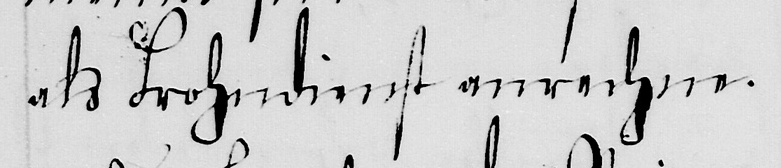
als Frohndienst anrechne.
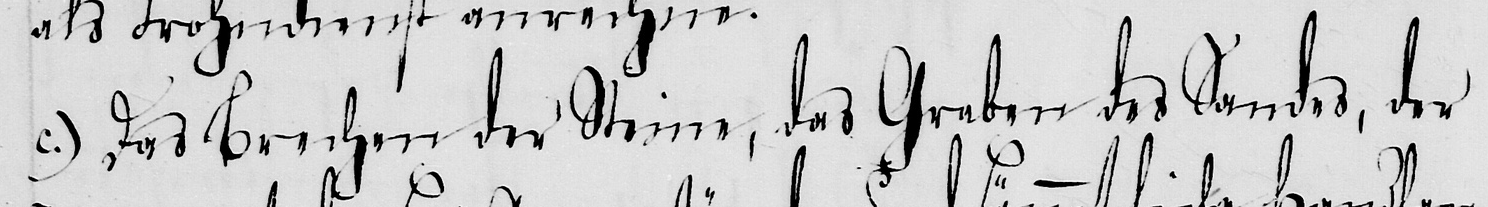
c.) Das Brechen der Steine, das Graben des Sandes, der
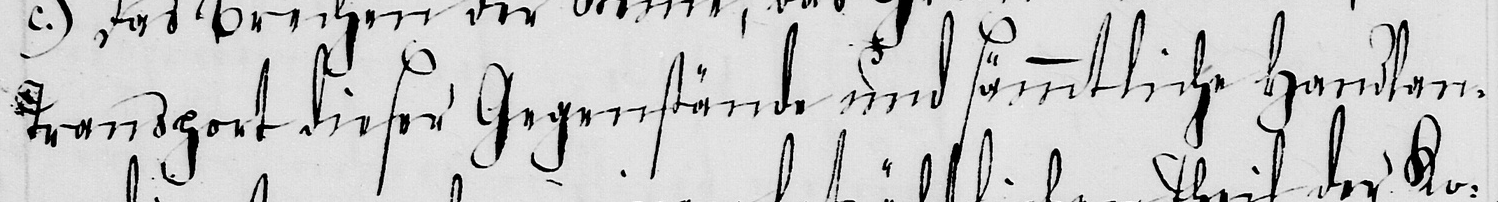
Transport dieser Gegenstände und sämmtliche Handlan¬
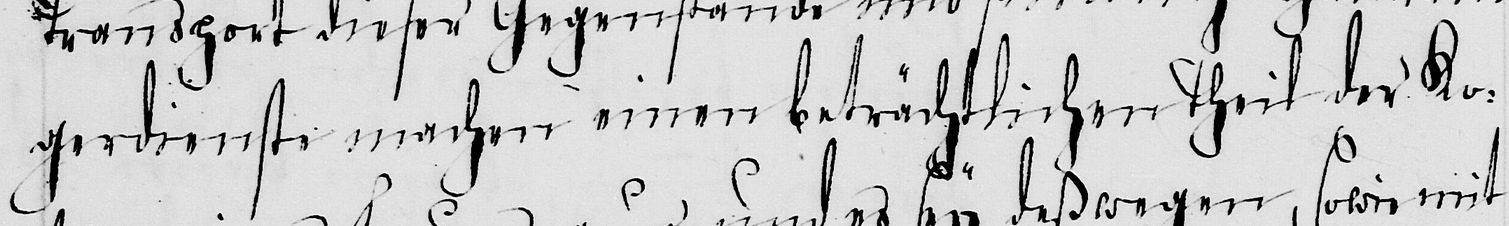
gerdienste machen einen beträchtlichen Theil der Ko¬
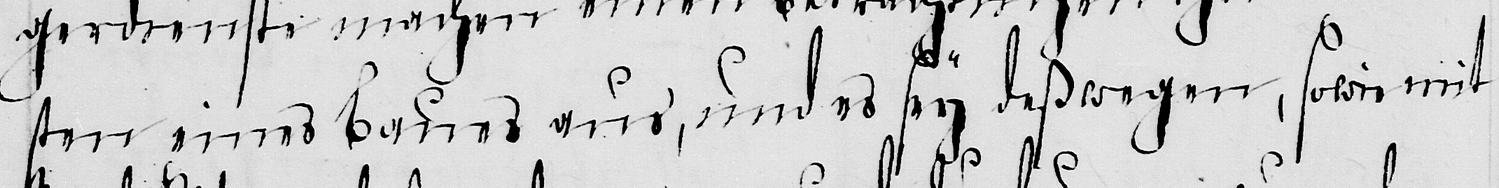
sten eines Baues aus, und es sey deßwegen, sowie mit
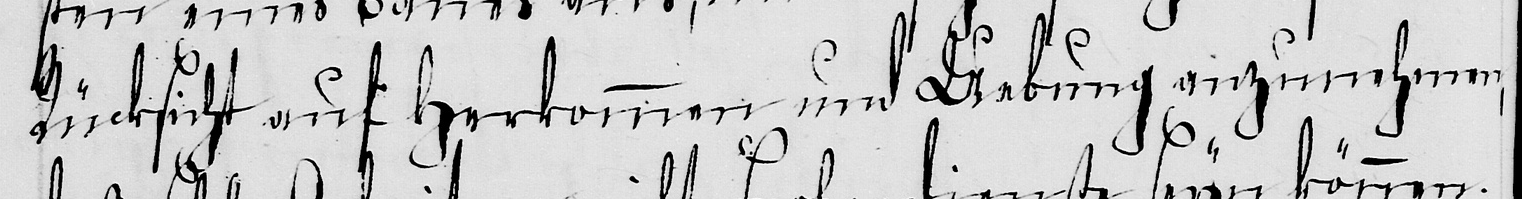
Rücksicht auf Herkommen und Uebung anzunehmen,
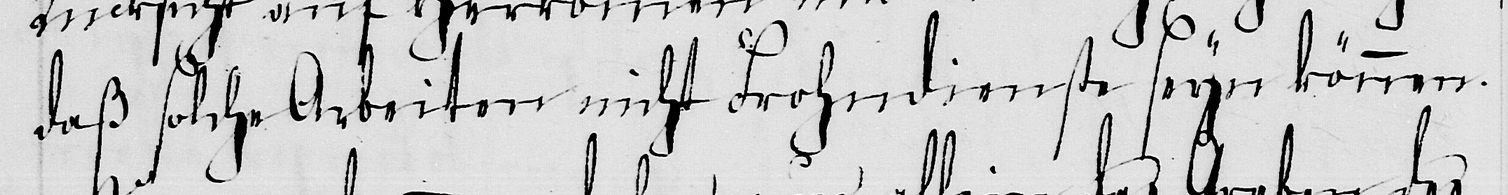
daß solche Arbeiten nicht Frohndienste seyn können.
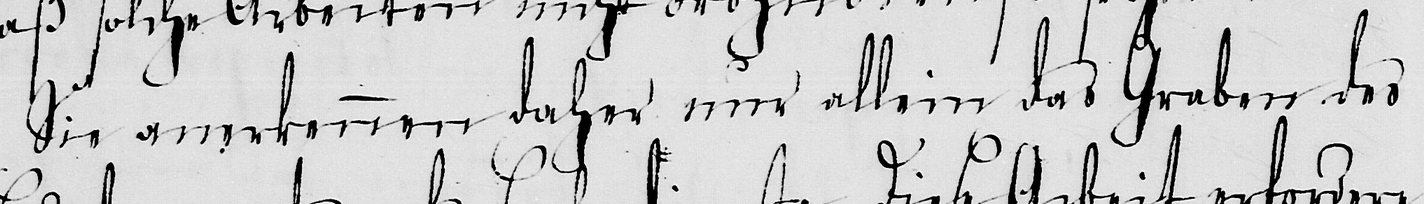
Sie anerkennen daher nur allein das Graben des
